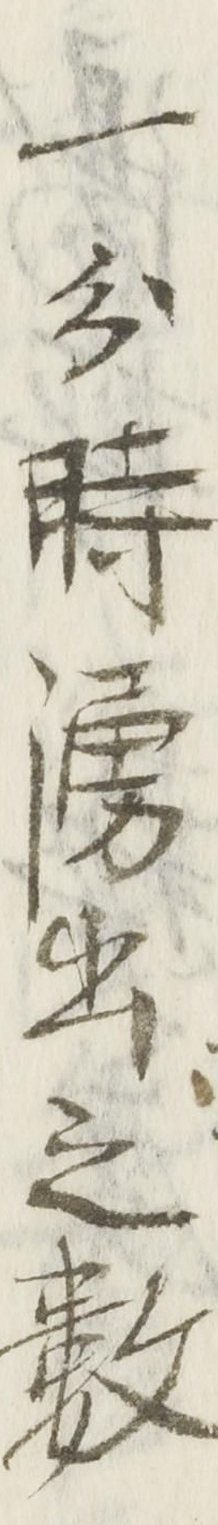一分時湧出之数
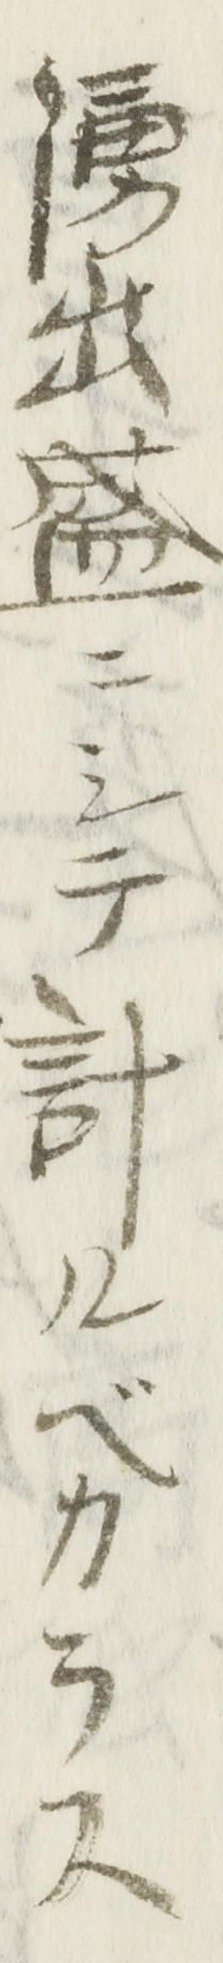湧出盛ニシテ計ルべカラス
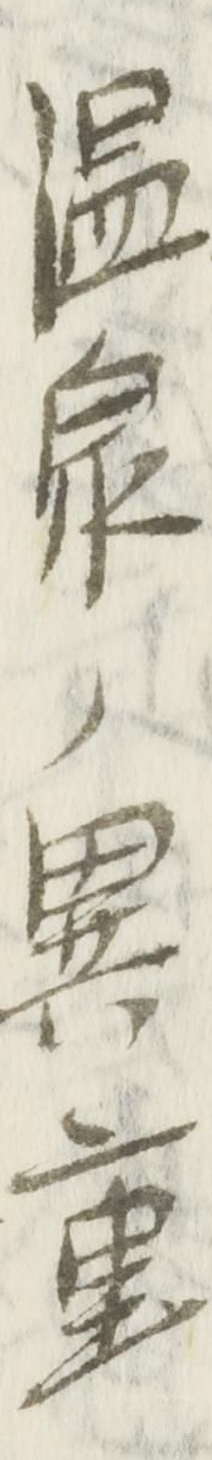温泉ノ異重
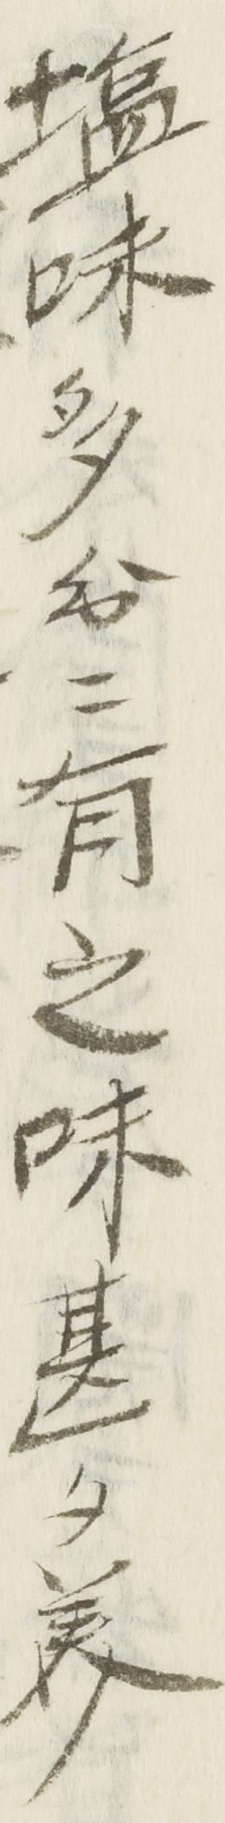塩味多分ニ有之味甚タ美
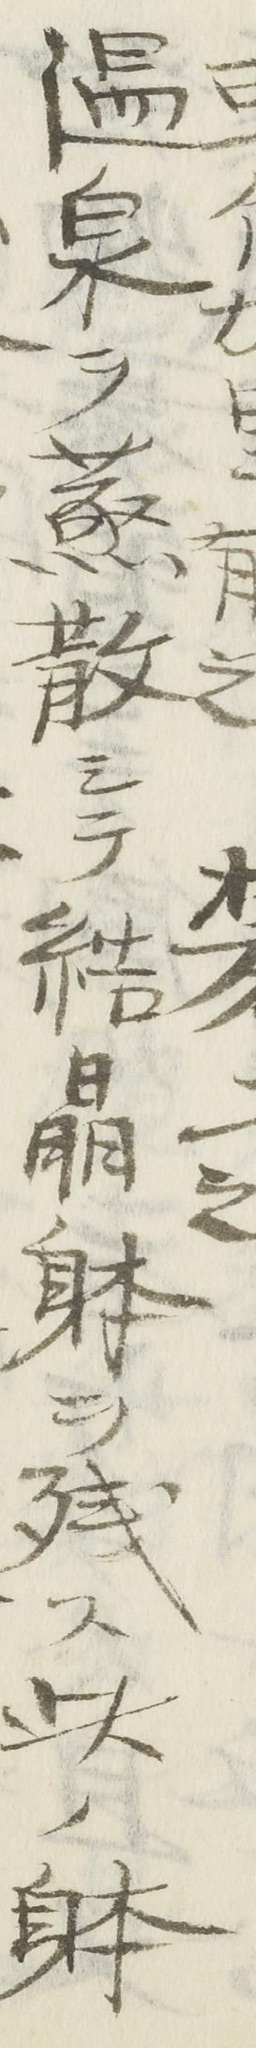温泉ヲ蒸散シテ結晶躰ヲ残ス此ノ躰
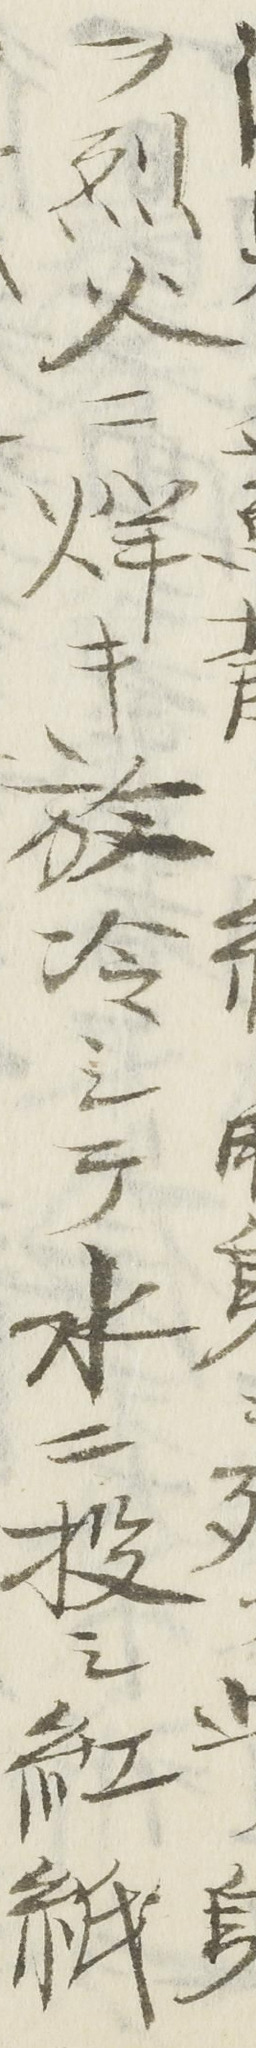ヲ烈火ニ烊キ放冷シテ水ニ投シ紅紙
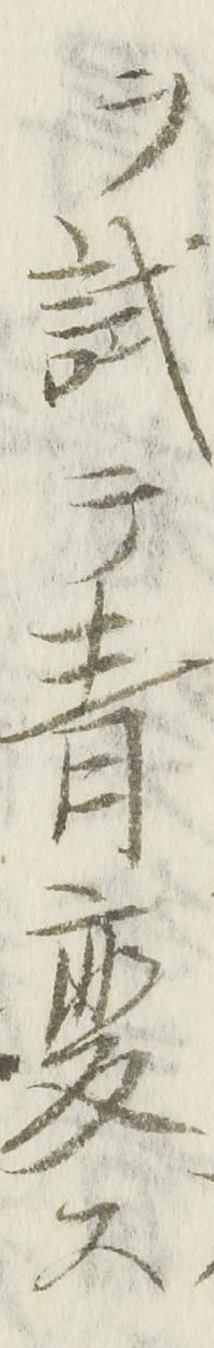ヲ試テ青変ス
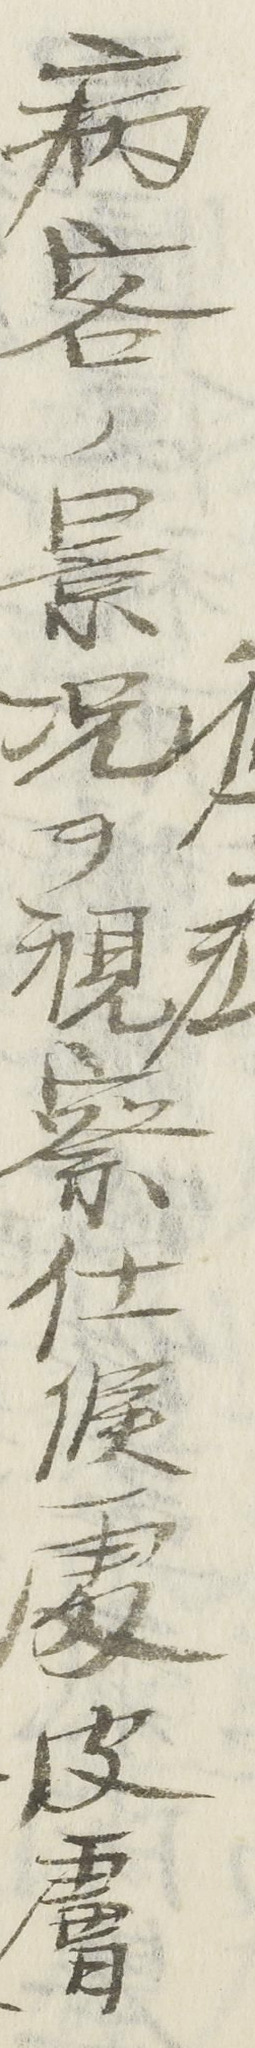病客ノ景況ヲ視察仕候霞皮膚
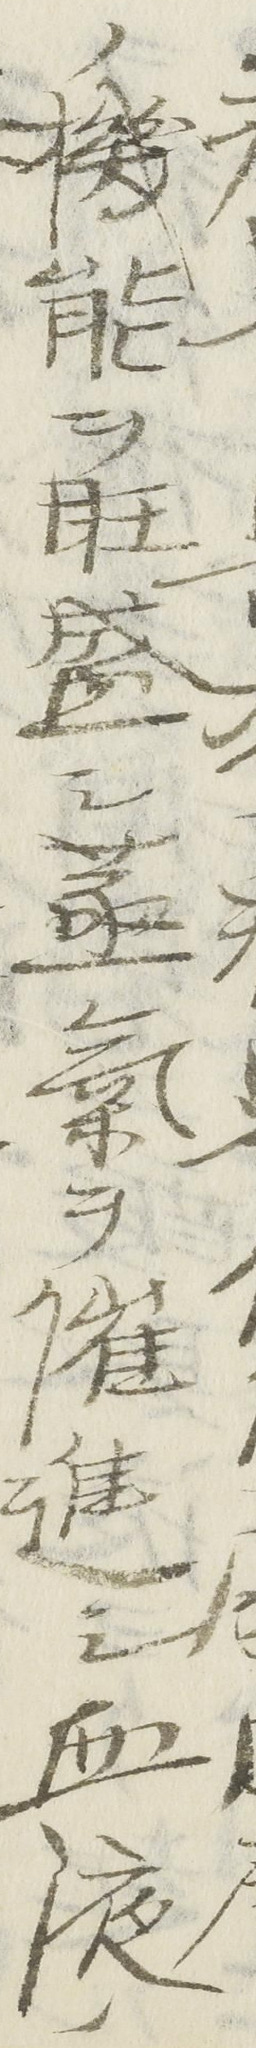ノ機能ヲ旺盛シ蒸氣ヲ催進シ血液ノ
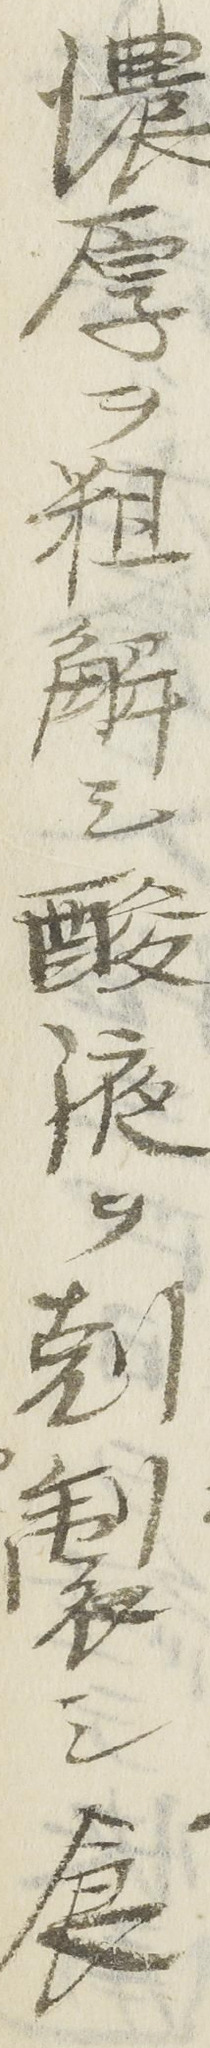濃厚ヲ粗解シ酸液ヲ剋製シ食

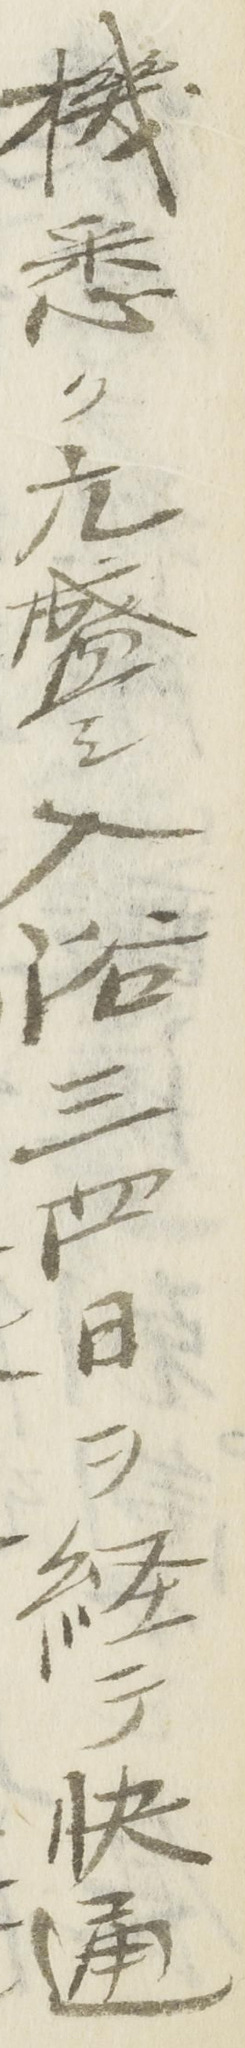機悉ク亢盛シ入浴三四日ヲ経テ快通
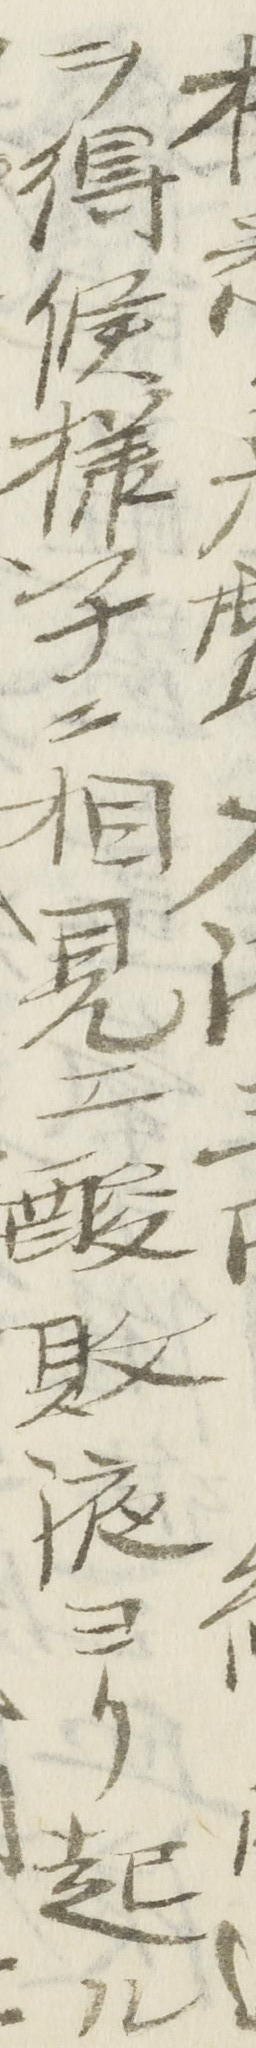ヲ得候様子ニ相見エ酸敗液ヨリ起ル
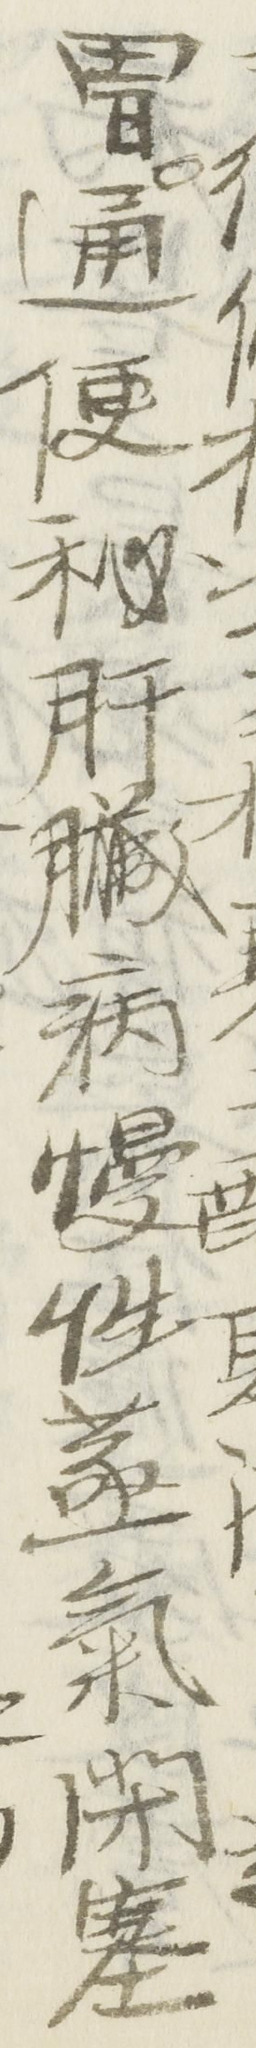胃通便秘肝臓病慢性蒸気閉塞
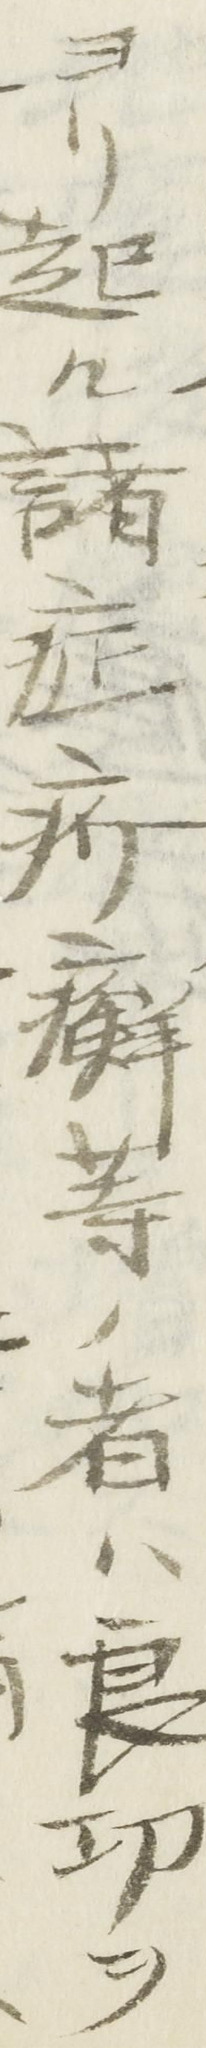ヨリ起ル諸症疥癬等ノ者ハ良功ヲ
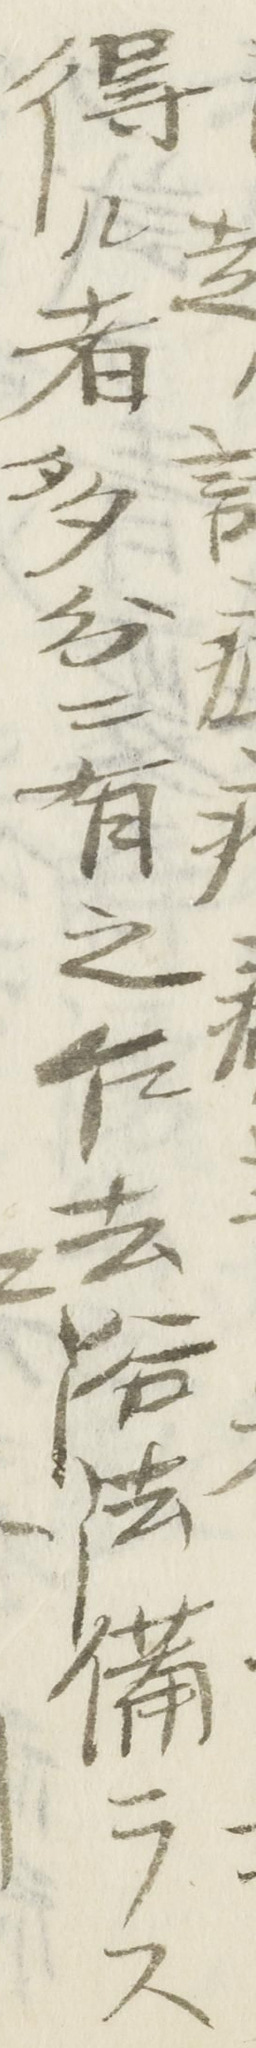得ル者多分ニ有之乍去浴法備ラス
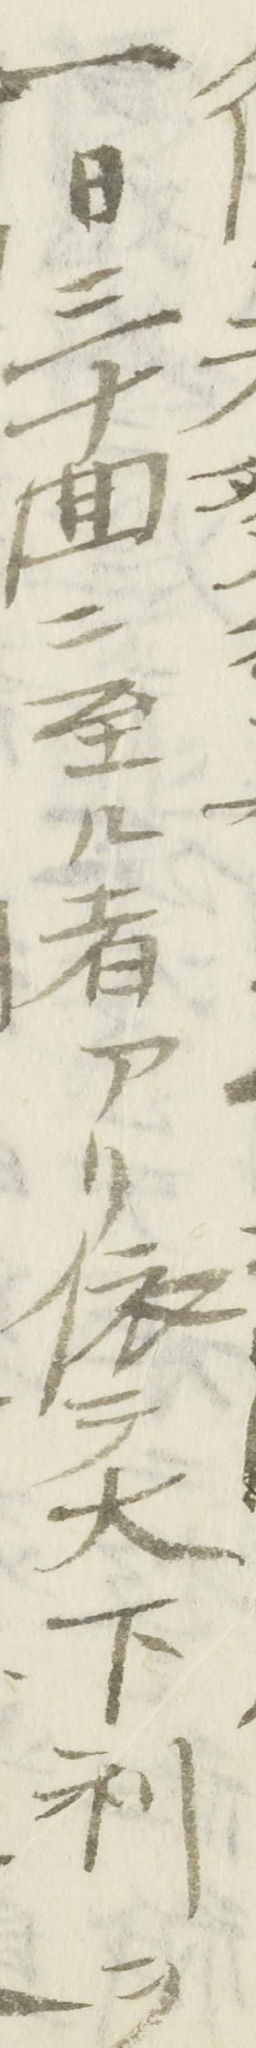一日三十回ニ至ル者アリ依テ大下利ヲ
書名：温冷泉試験表
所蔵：東京大学地震研究所図書室 Earthquake Research Institute Library, The University of Tokyo, JAPAN
